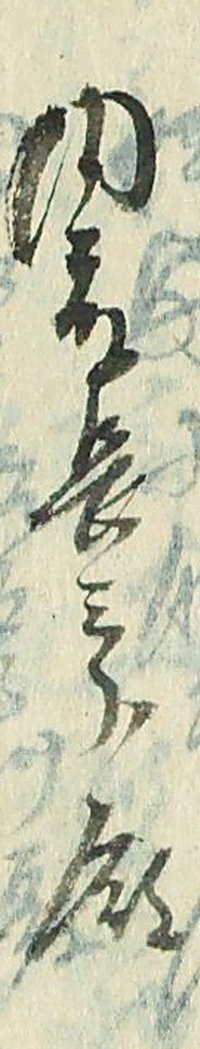内藤長三郎殿
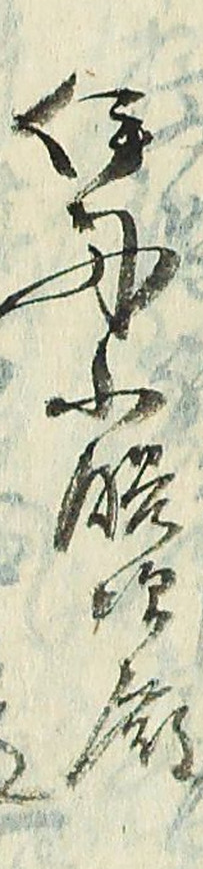伊丹小膳次殿
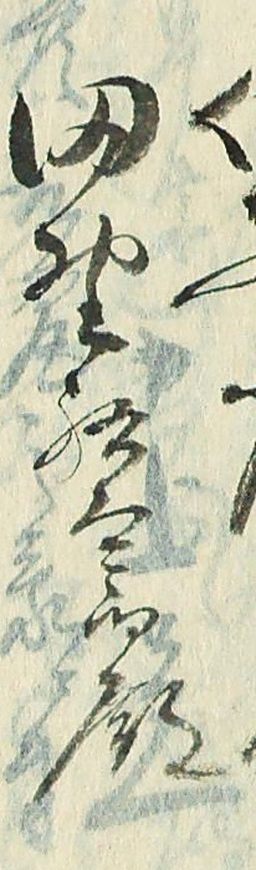田野祐太郎殿

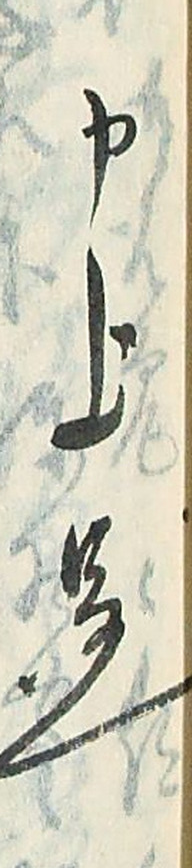申上覚
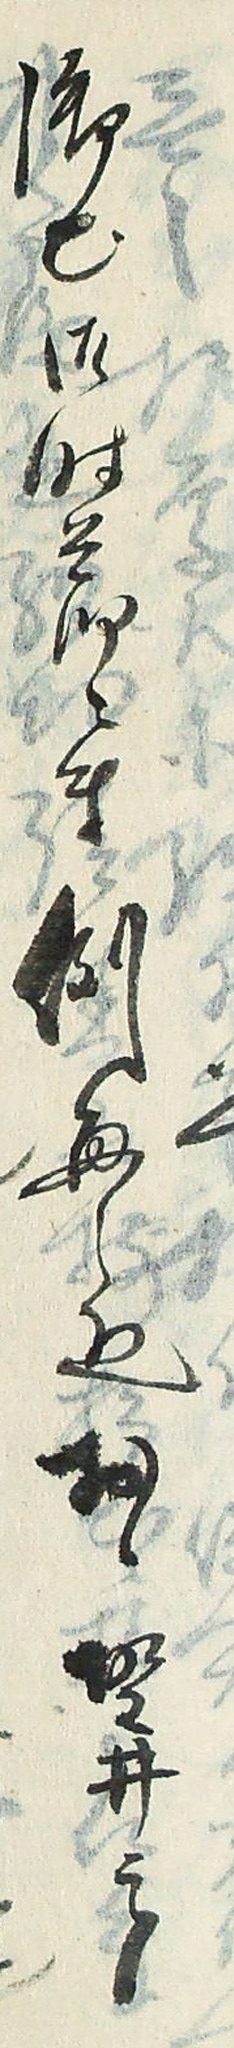御出御時節に付き例毎之通村々野井戸
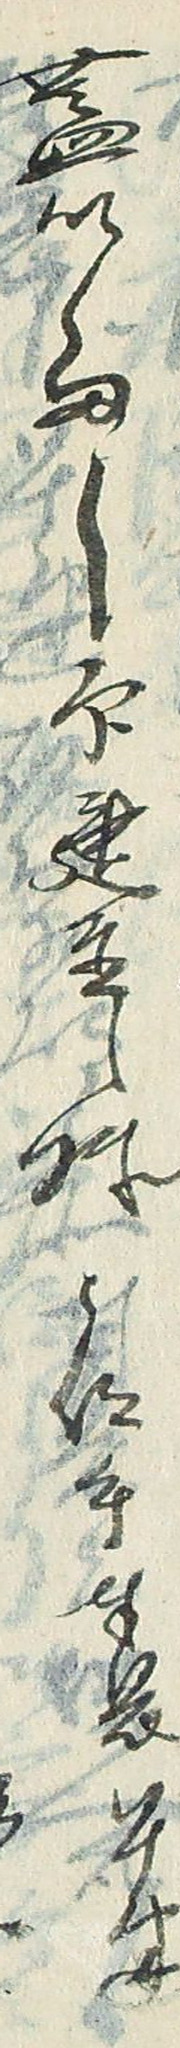蓋いたし印建置候様被仰付奉畏早速
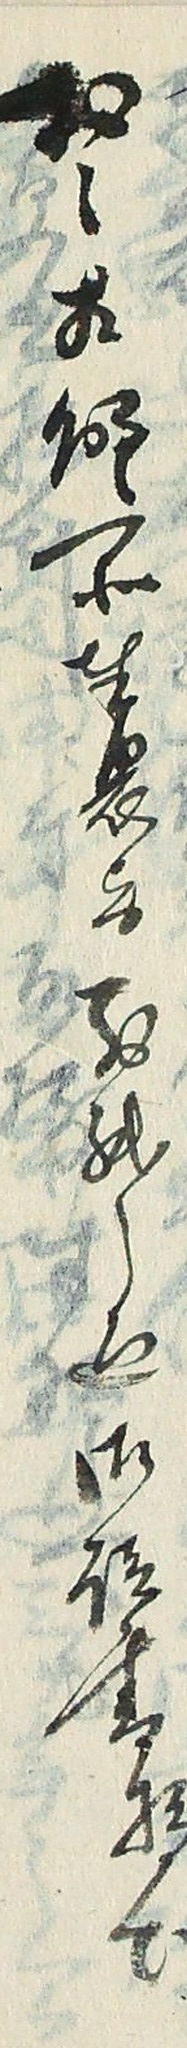村々相触候所奉畏旨別紙之通御請書指出
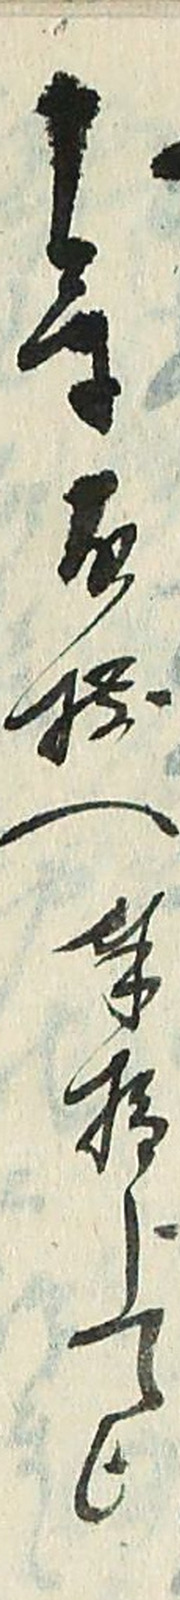申に付取揃へ奉指上候以上
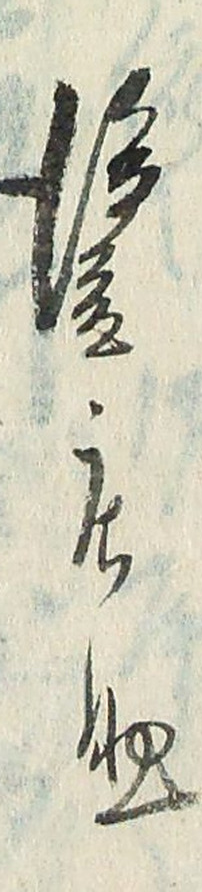後藤庄助
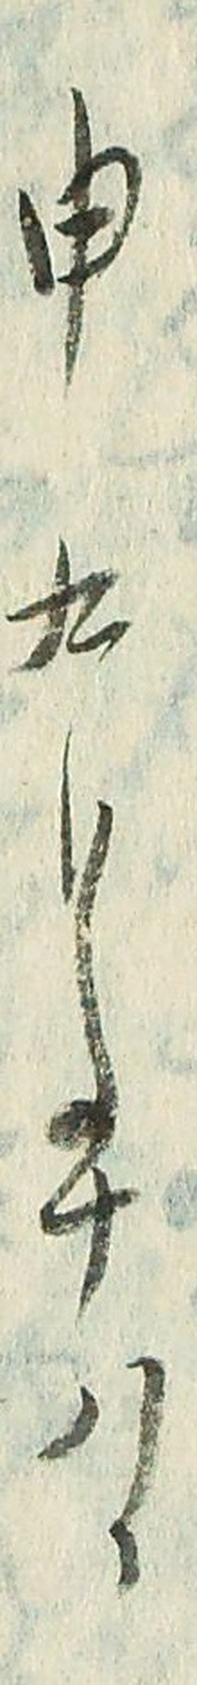申九月十八日
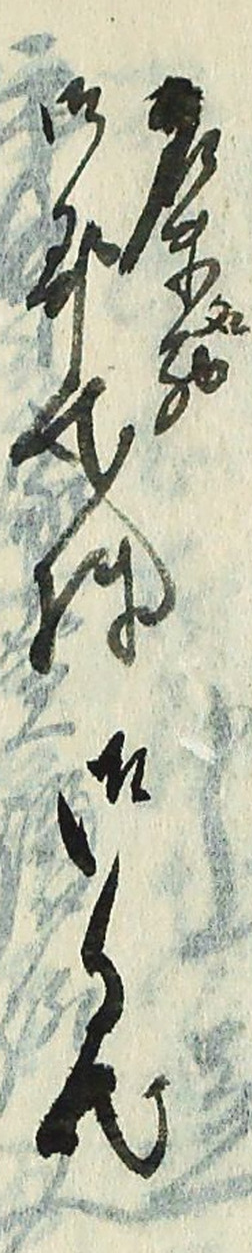御郡代様御手代
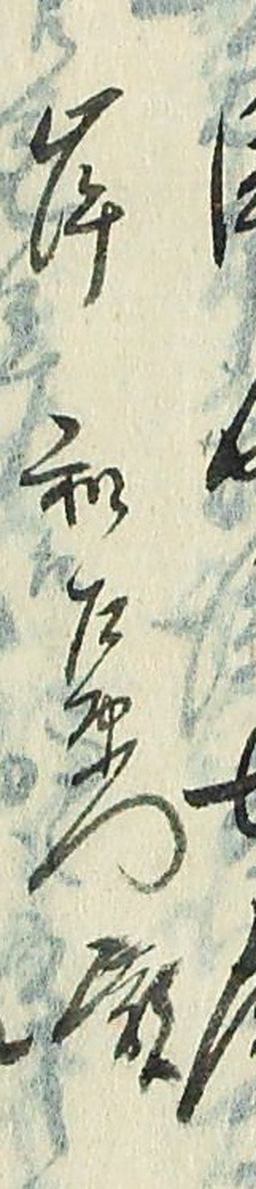岸和左衛門殿
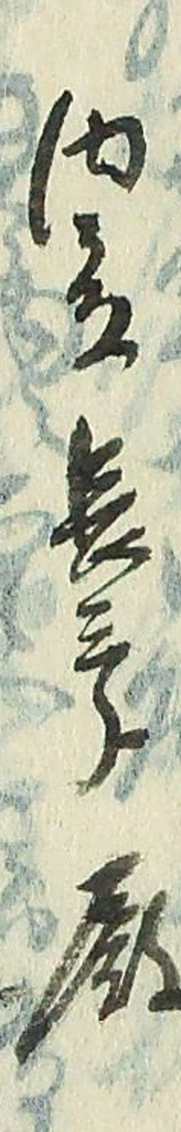内藤長三郎殿
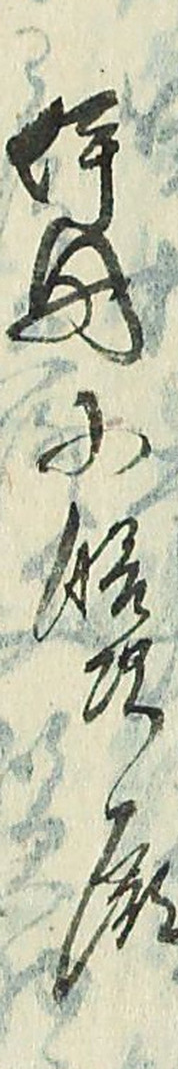伊丹小膳次殿
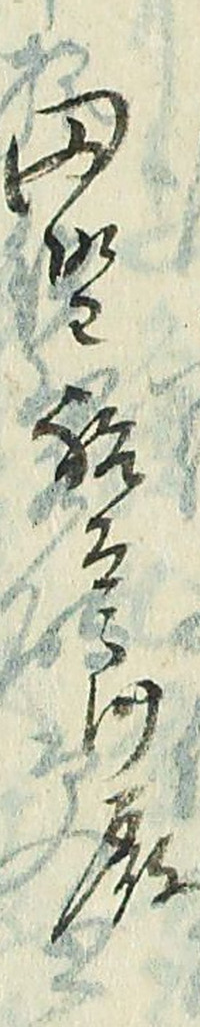田野祐太郎殿
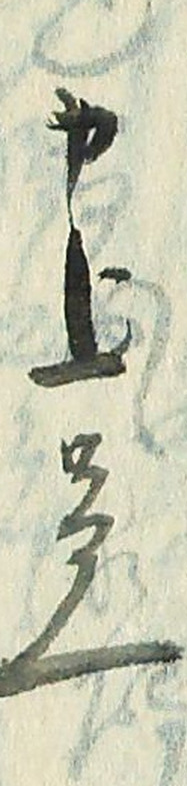申上覚
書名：諸御用御□受書控
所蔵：鳴門教育大学 Naruto University of Education
